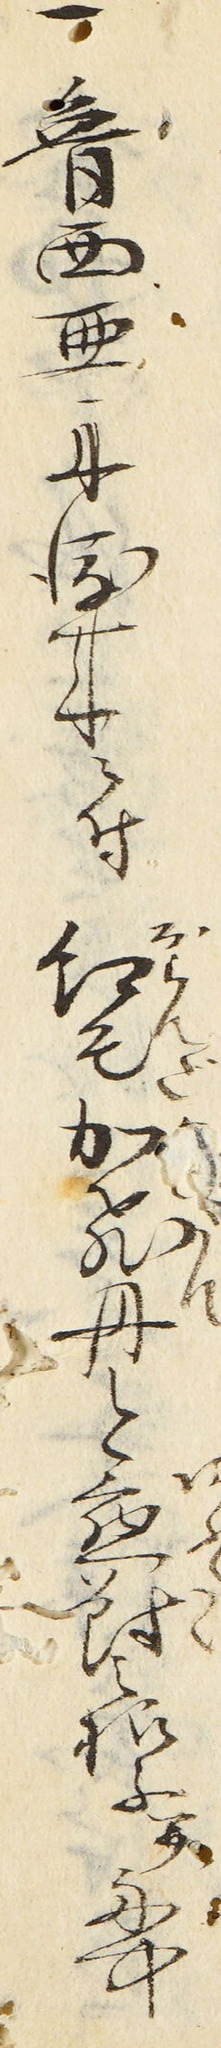魯西亜舟渡来に付紅毛加飛丹と応対之様子幷舟中

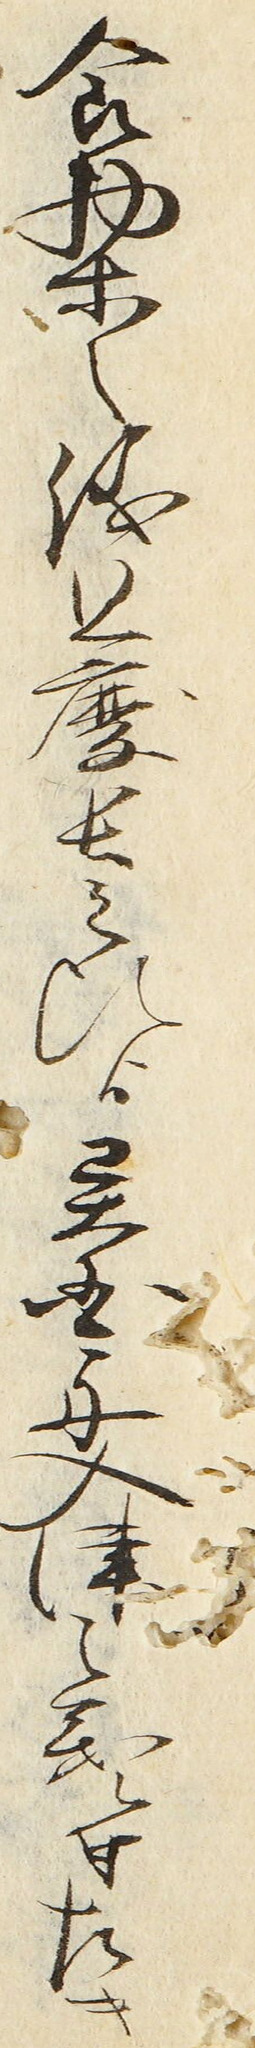食物等之儀且慶長之頃より異国舟入津之義に付古き
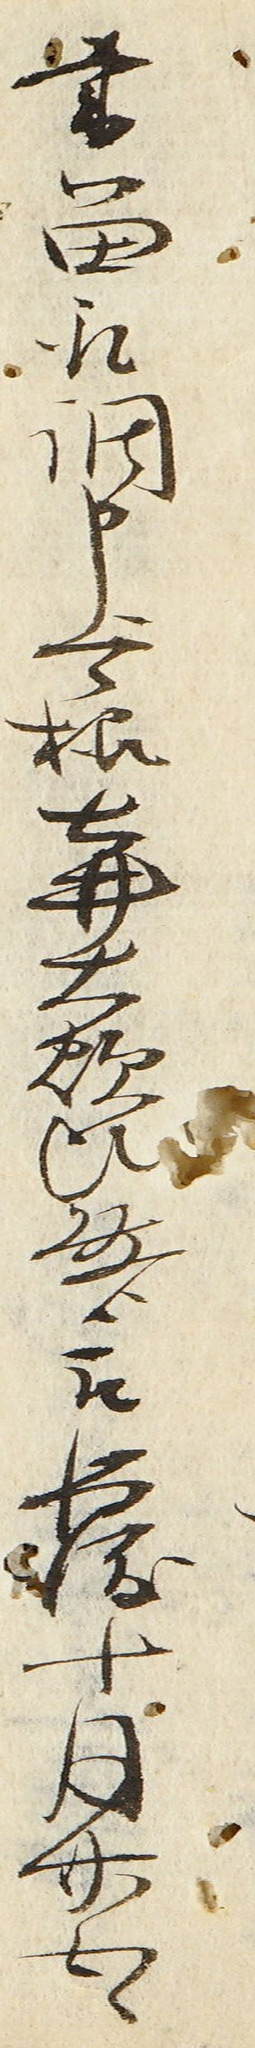書留被調申上候様土井大炊頭殿より被仰渡十月廿五日
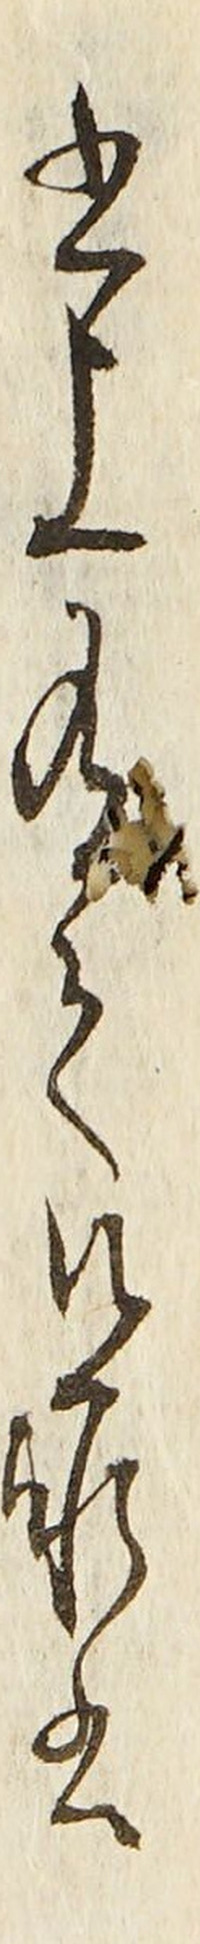書上有之之御承書
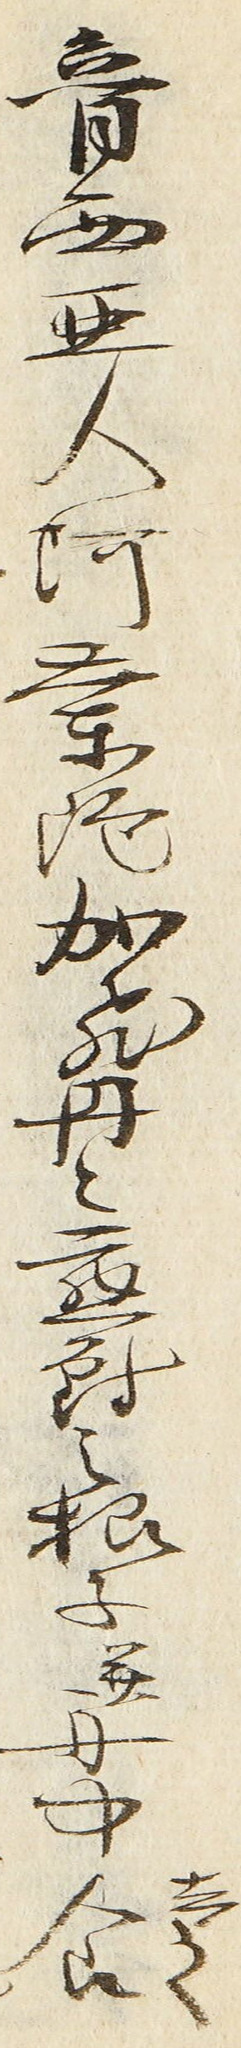魯西亜人阿蘭陀加飛丹と応対之様子幷舟中食
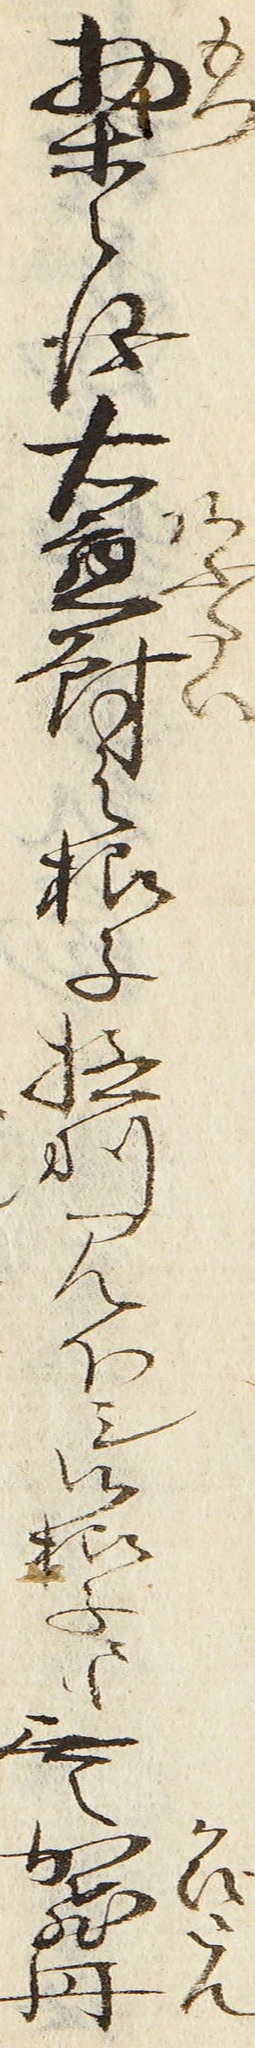物等之儀右応対之様子格別見下し候様子にも無之加飛丹
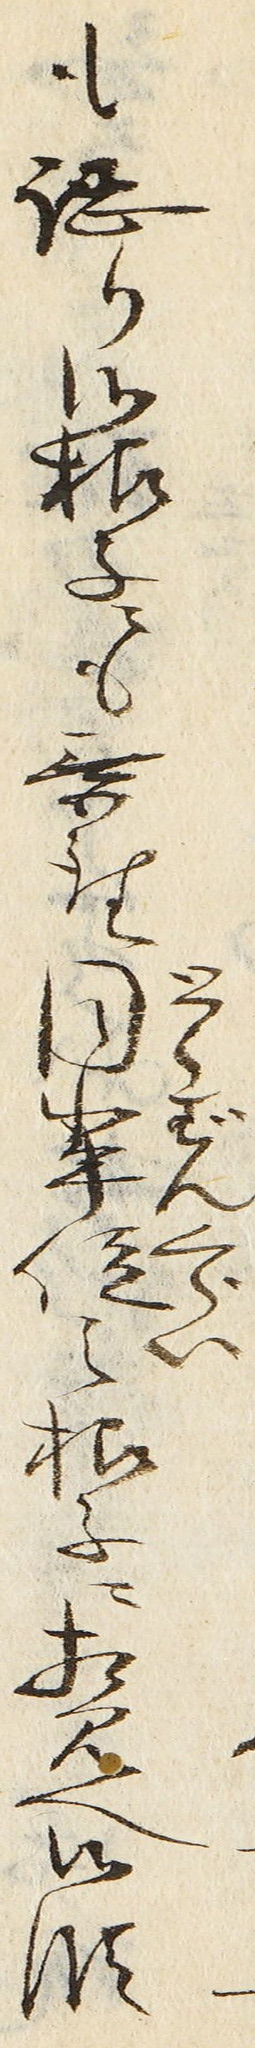も認り候様子にも無御座候同輩位之様子に相見へ候段
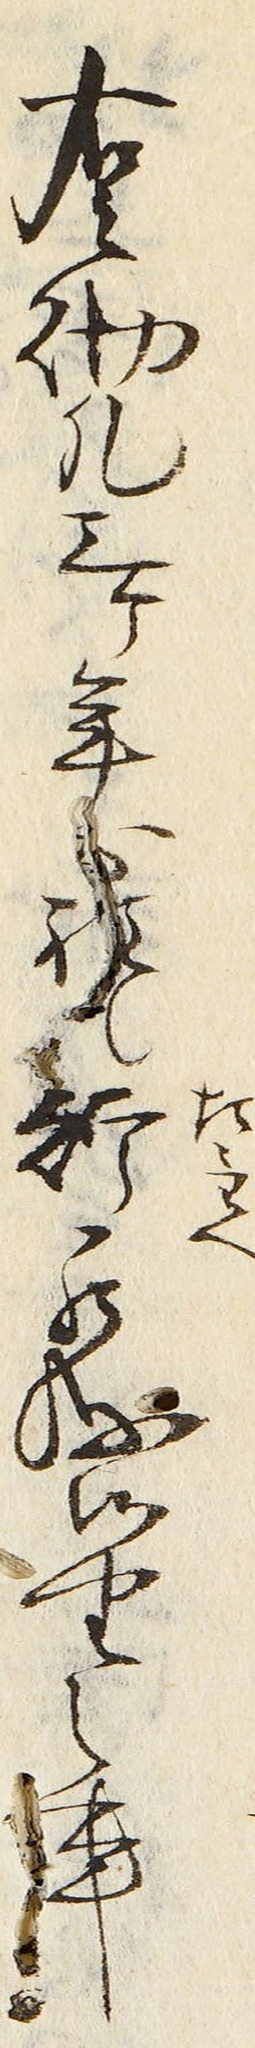右之砌凡三ヶ年分程も貯罷越候由之事
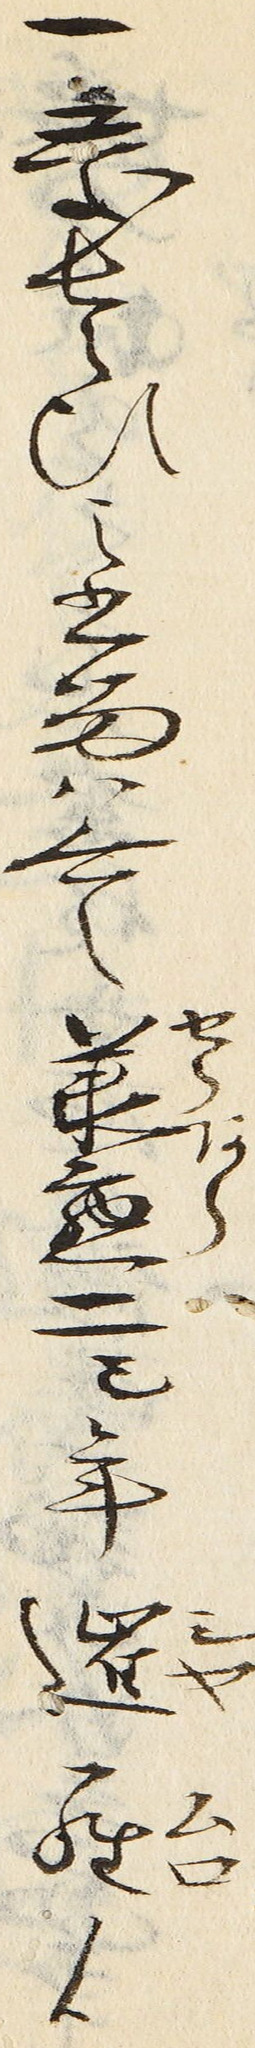一慶長之頃之書留は無之承応二巳年暹羅より
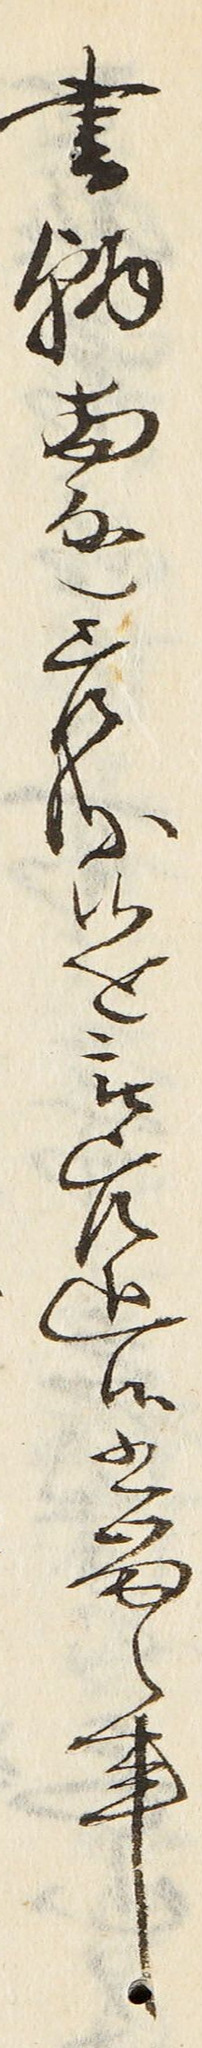書翰両通差越候を被差通候書留之事
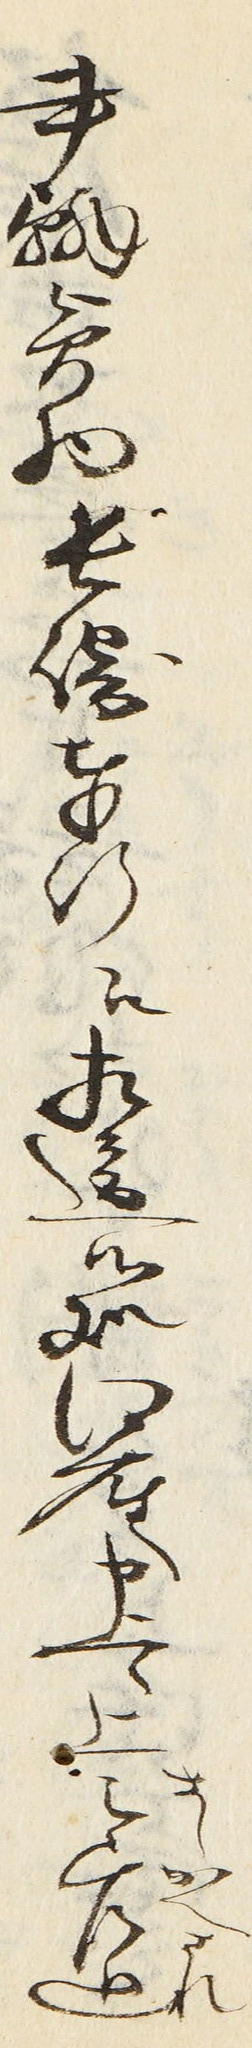書翰音物長崎奉行え相送候処江府へ申上候上被差返
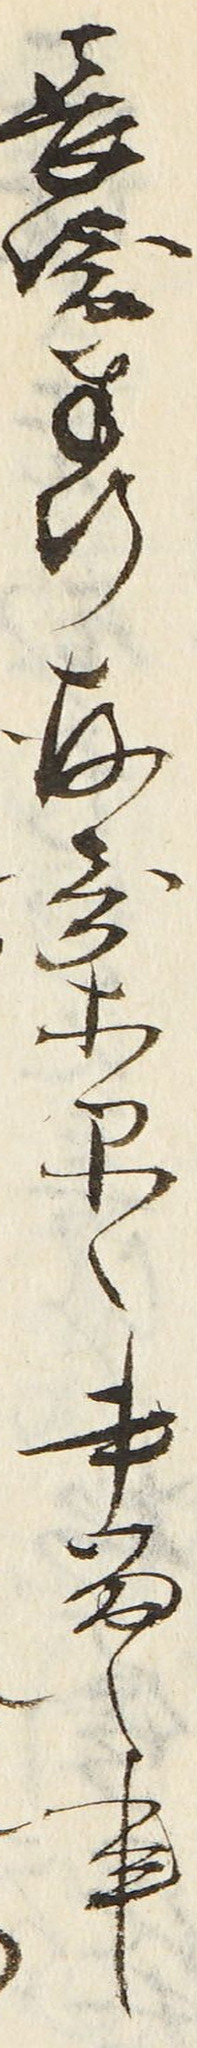長崎奉行存寄等に品々書留之事
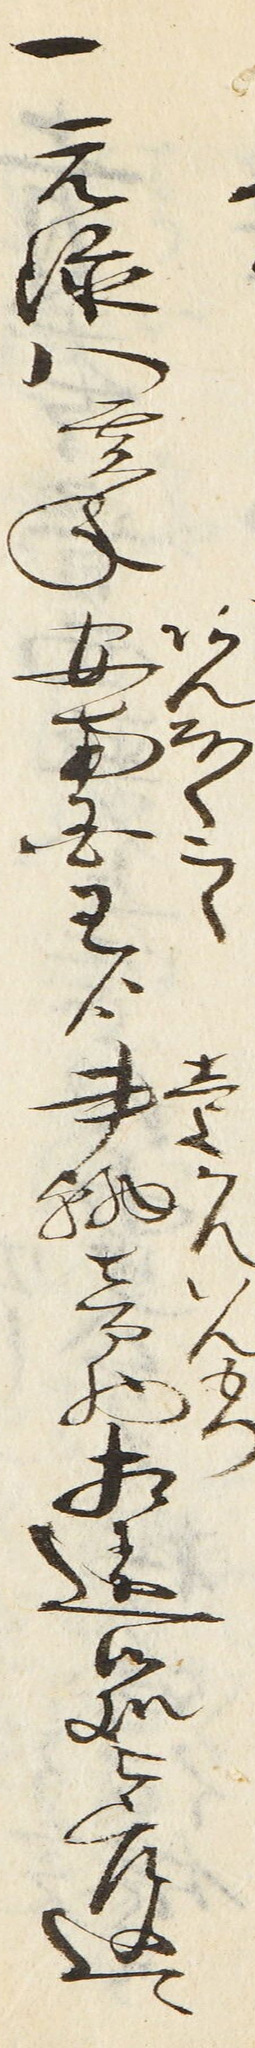一元禄八亥年安南国王より書翰音物相送候処被差返候
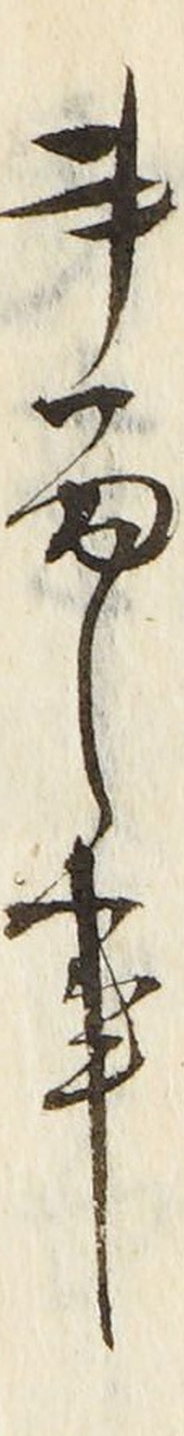書留之事
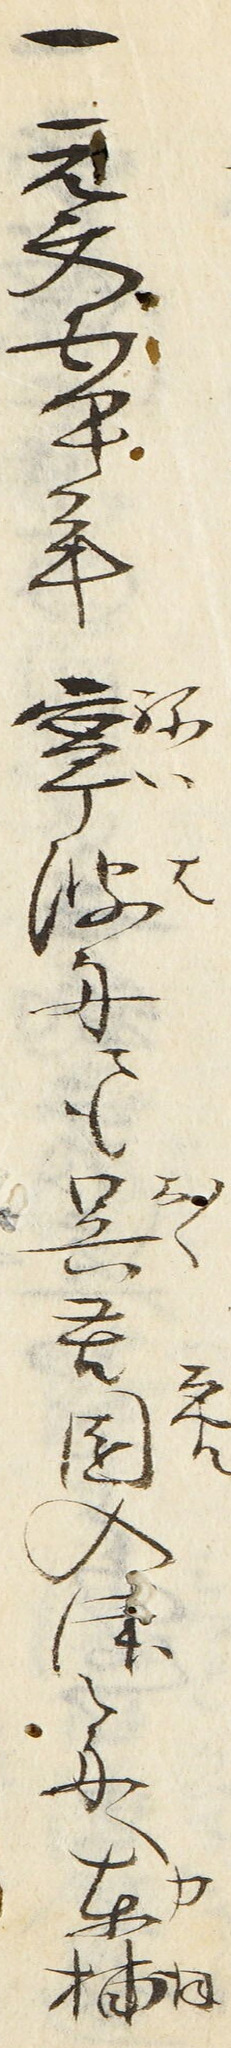一元文五申年寧波舟にも呉君園入津之舟へ柬埔
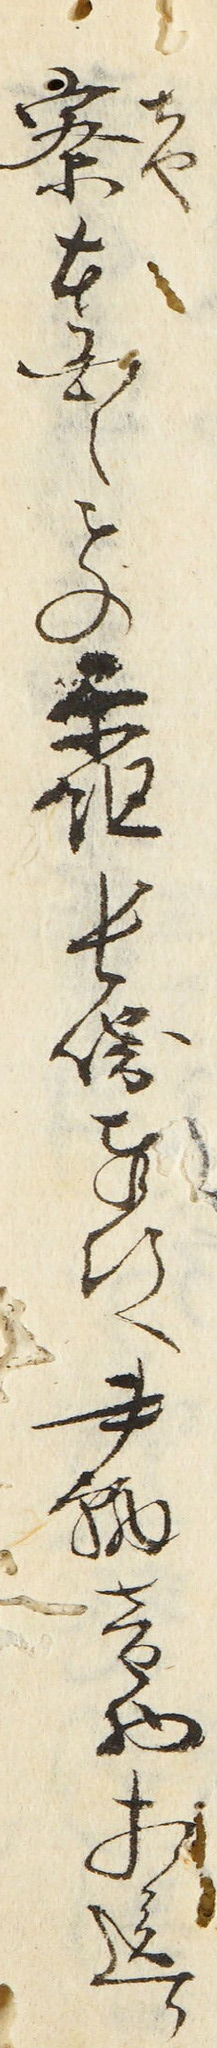寨本国之もの乗組長崎奉行へ書翰音物相送り
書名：魯西亜国舟渡来始末并日本流漂人異国遍歴之話（西洋欧羅巴州之内一）
